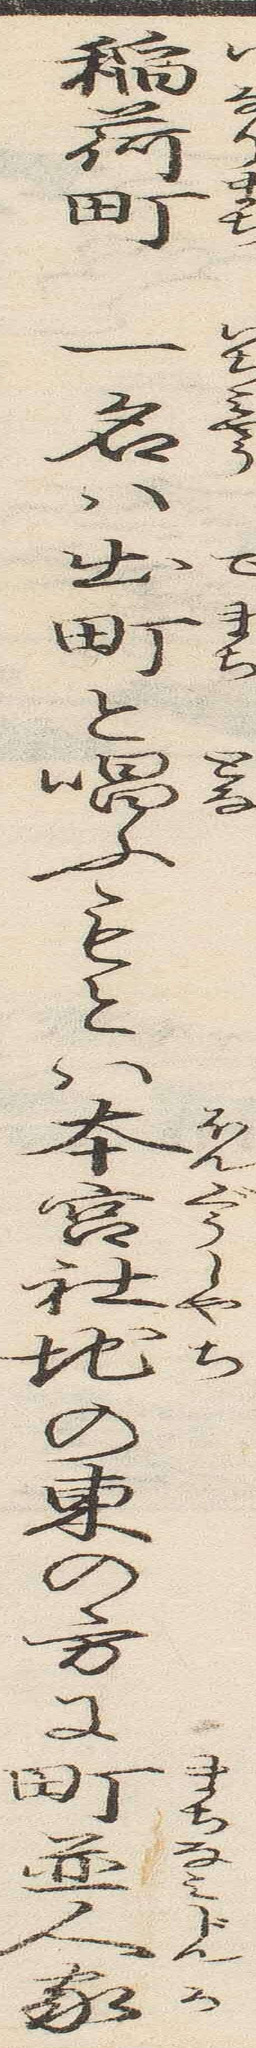稲荷町一名は出町と唱ふもとは本宮社地の東の方に町並人家
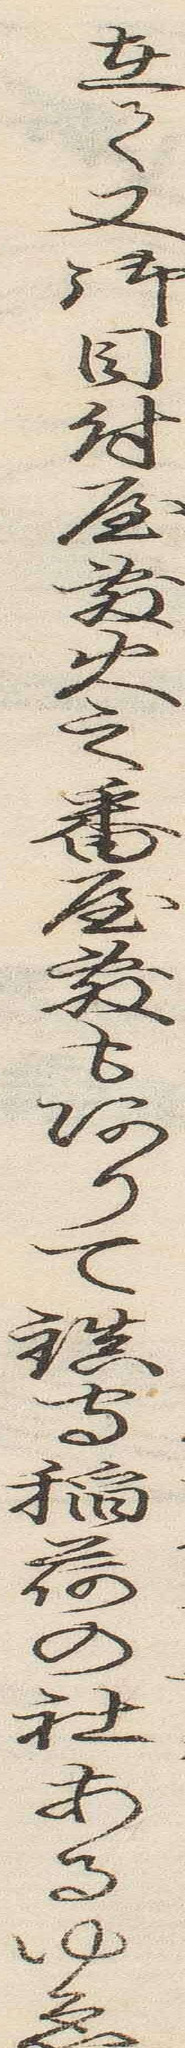在て又御目付屋敷火之番屋敷もありて鎭守稲荷の社あるゆゑ
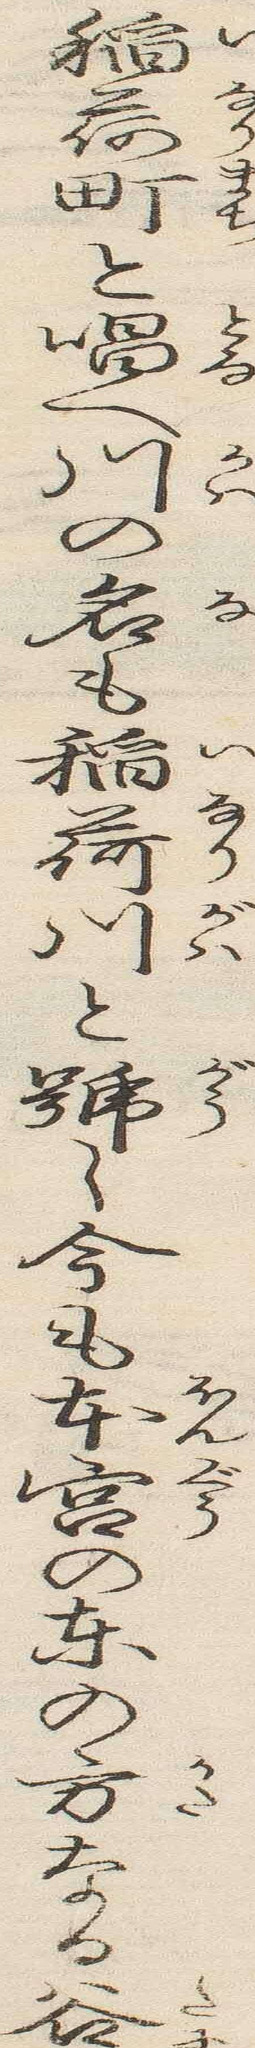稲荷町と唱へ川の名も稲荷川と號し今も本宮の東の方なる谷
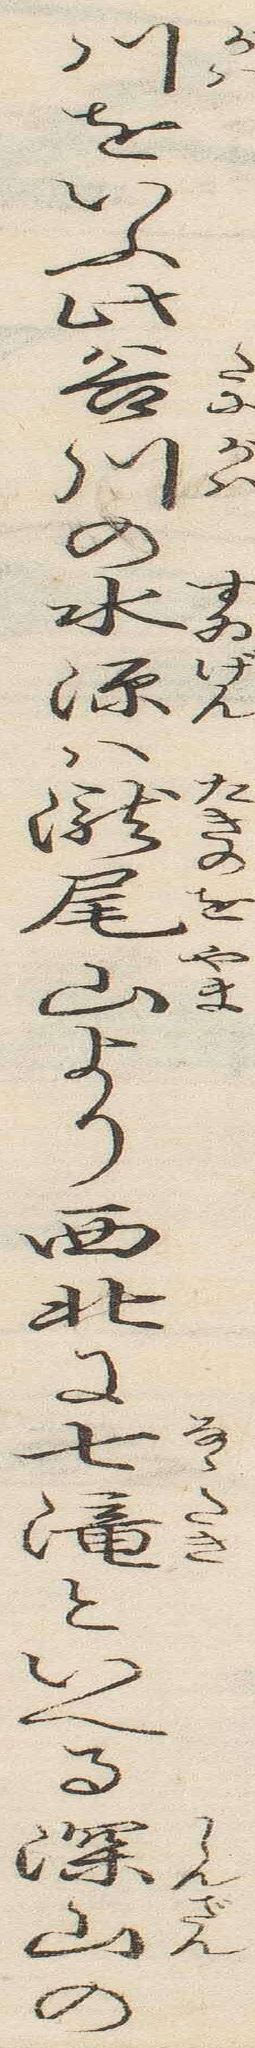川をいふ此谷川の水源は瀧尾山より西北に七滝といへる深山の
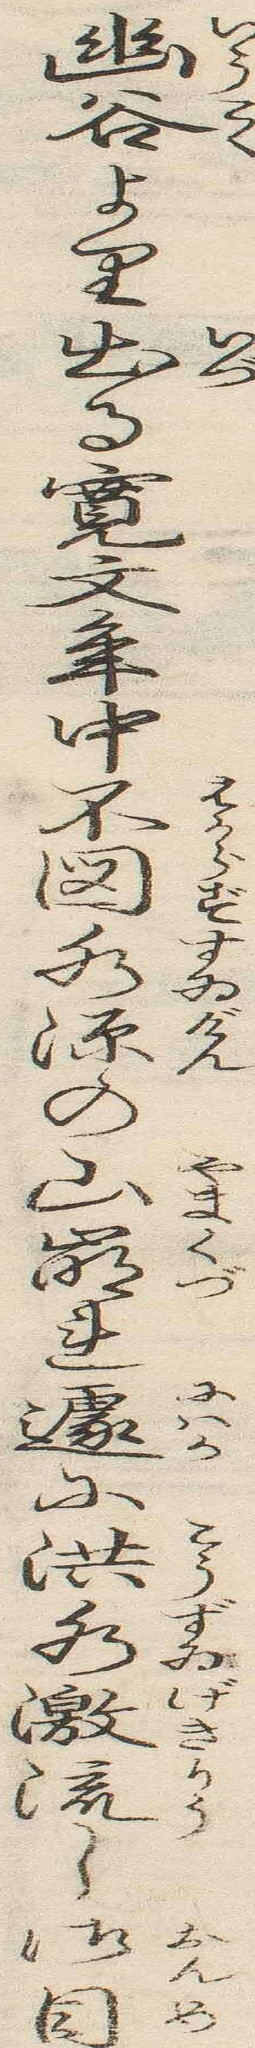幽谷より出る寛文年中不図水源の山崩れ遽に洪水激流し御目
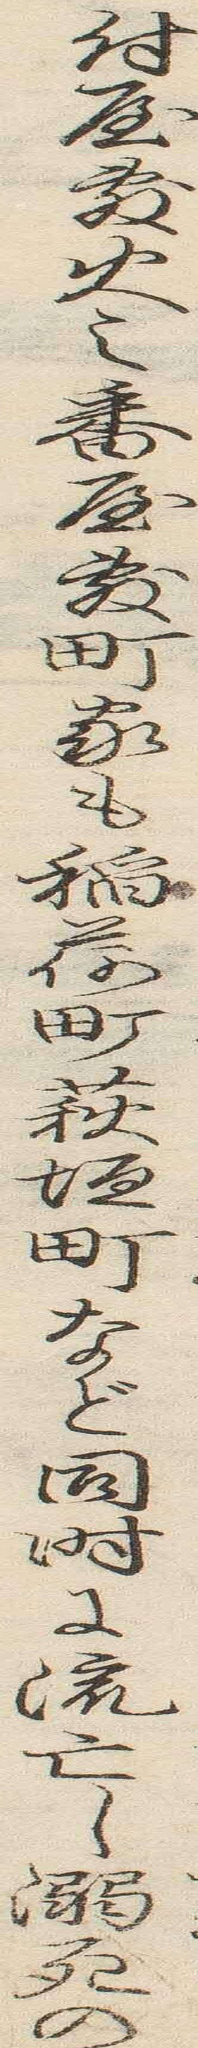付屋敷火之番屋敷町屋も稲荷町萩垣町など同时に流亡し溺死の
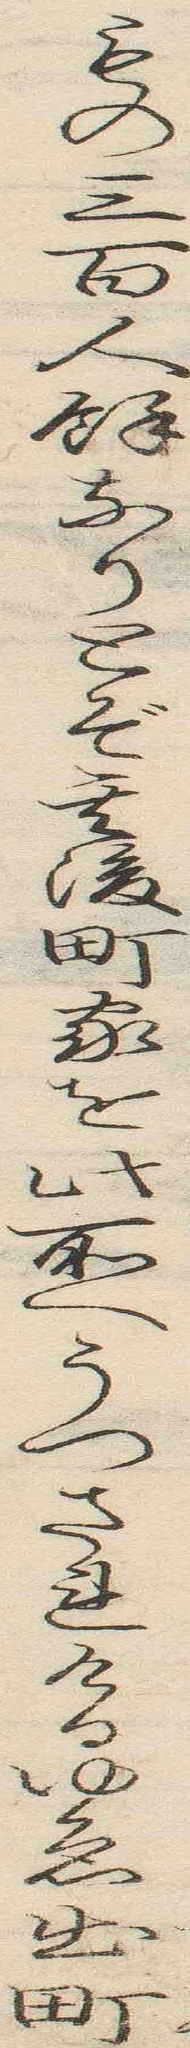もの三百人餘なりとぞ其後町家を此所へうつされけるゆゑ出町
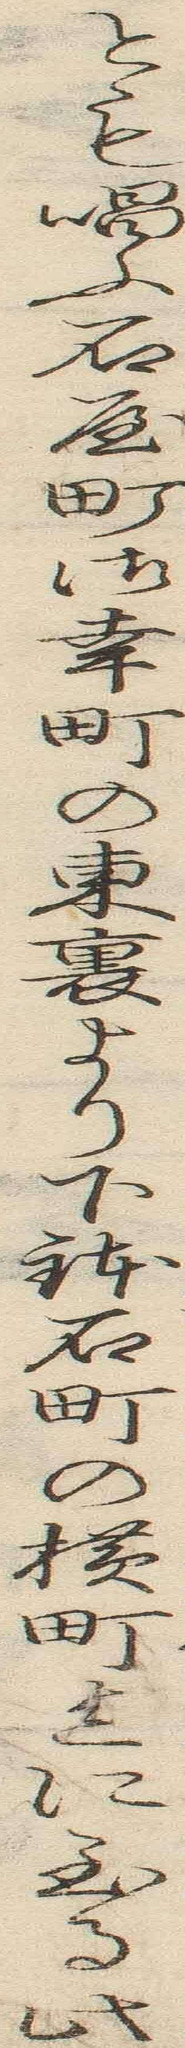とも唱ふ石屋町御幸町の東裏より下鉢石町の横町迠に至る此
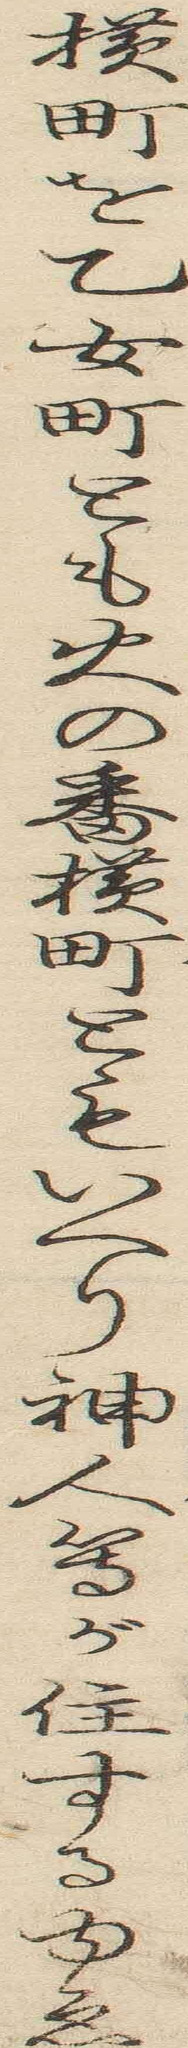横町を乙女町とも火の番横町ともいへり神人等が住するゆゑ

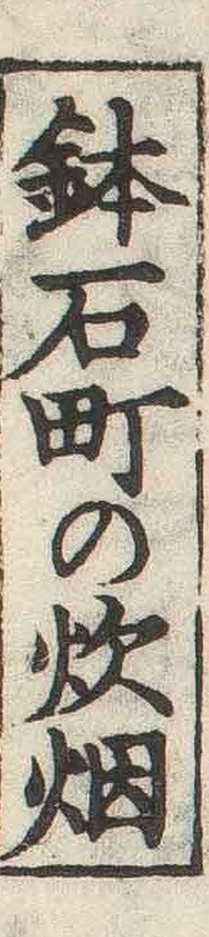鉢石町の炊烟

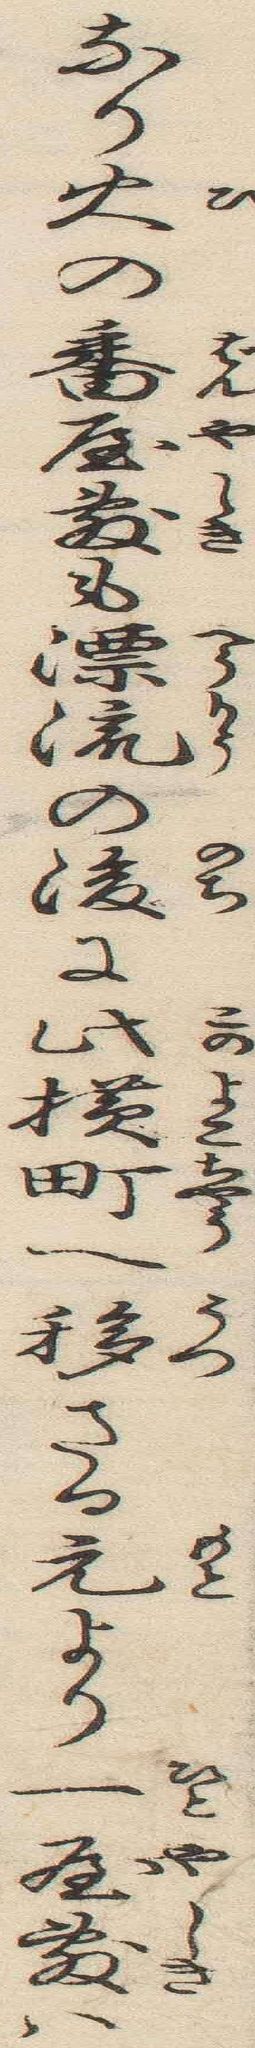なり火の番屋敷も漂流の後に此横町へ移さる元より一屋敷は
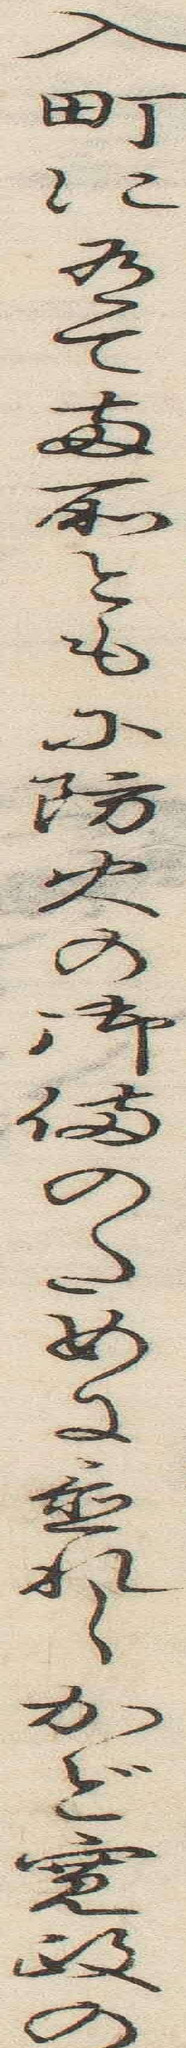入町に有て両所ともに防火の御備のために置れしかど寛政の
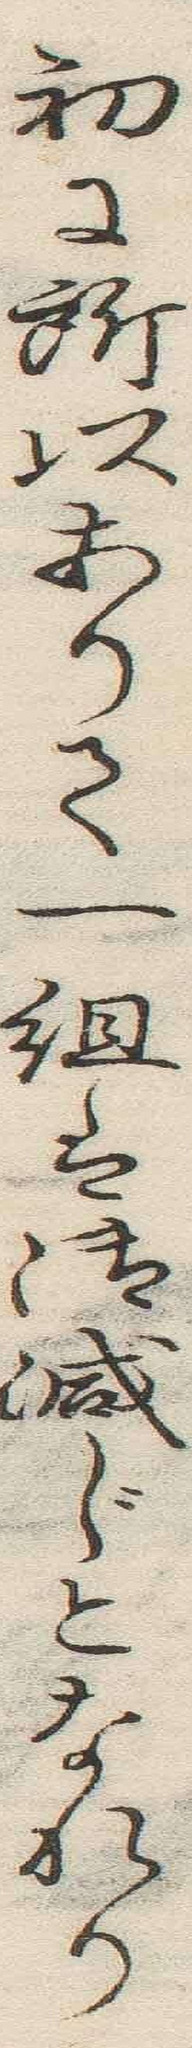初に所以ありて一組は御減じとなれり
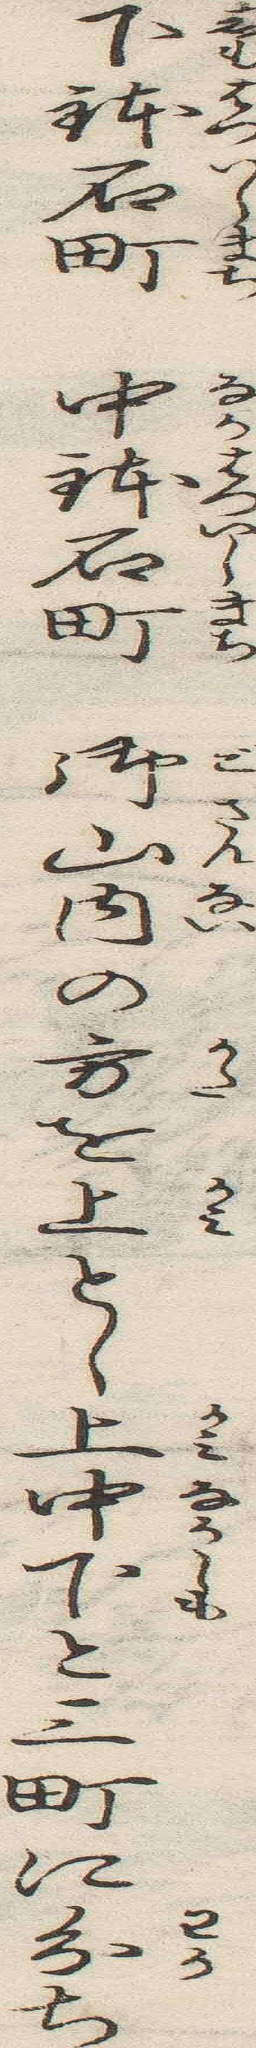下鉢石町中鉢石町御山内の方を上とし上中下と三町に分ち
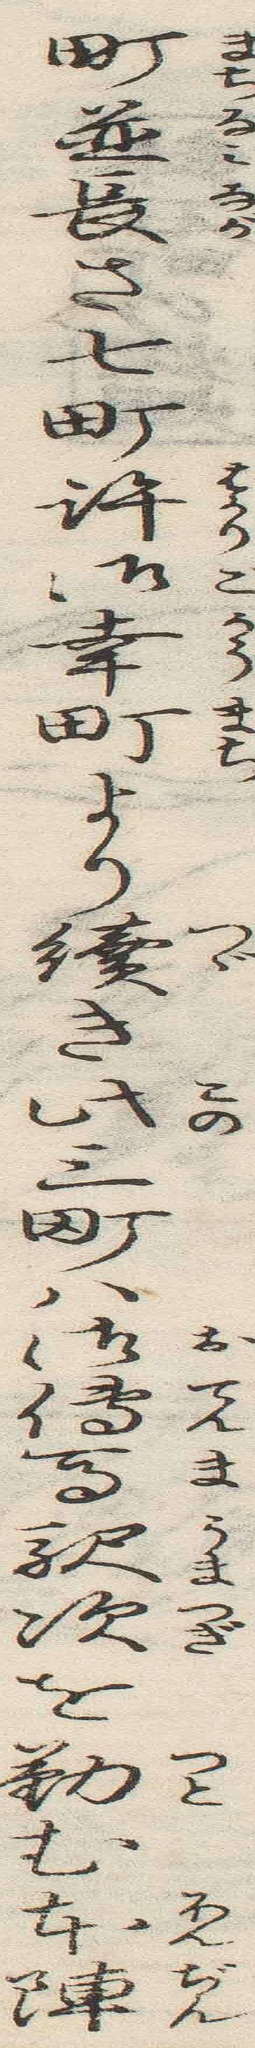町並長さ七町許御幸町より續き此三町は御傳馬駅次を勤む本陣
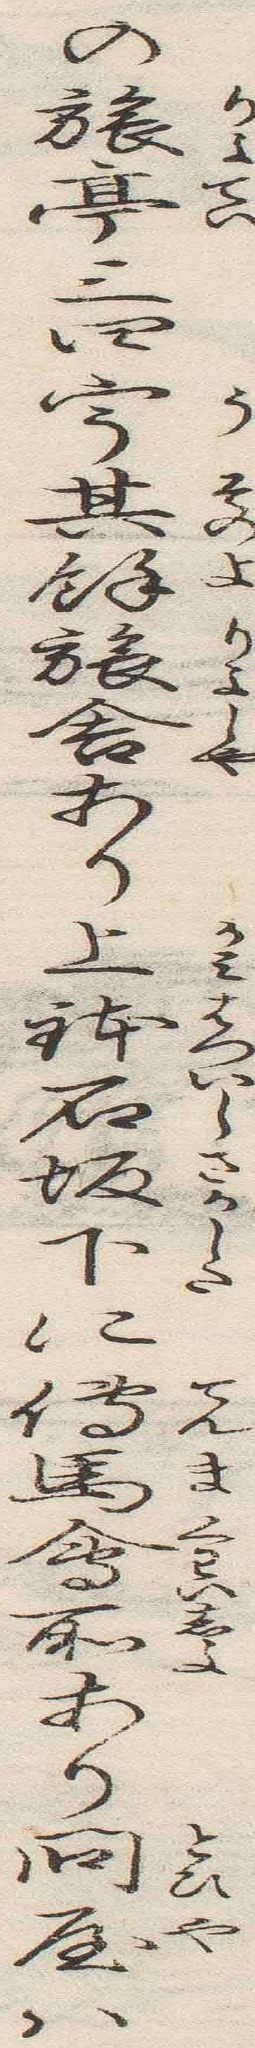の旅亭三四宇其餘旅舎あり上鉢石坂下に傳馬會所あり問屋は
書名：日光山志
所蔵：東京学芸大学附属図書館 国文学研究資料館
